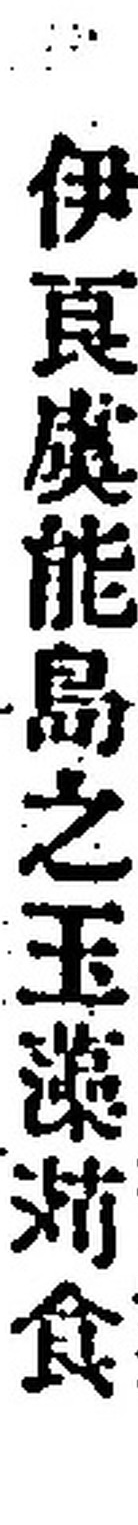伊良虞能島之玉藻苅食
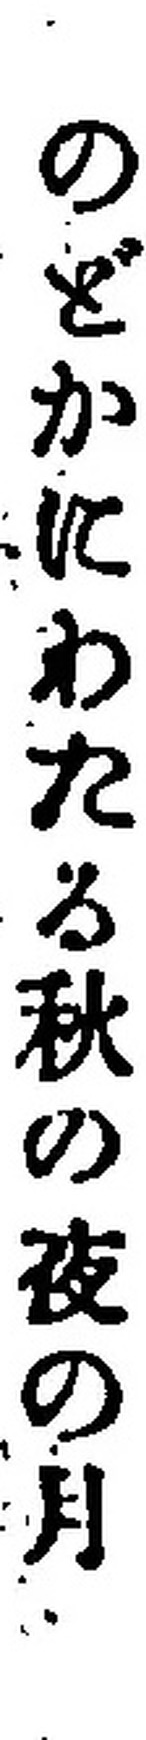のどかにわたる秋の夜の月
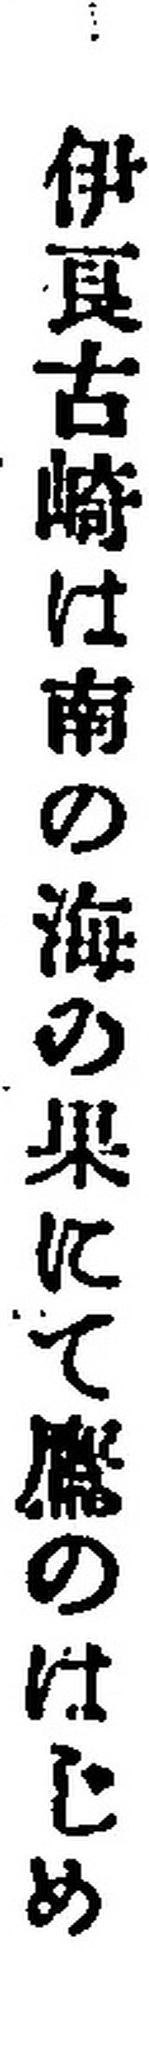伊良古崎は南の海の果にて鷹のはじめ
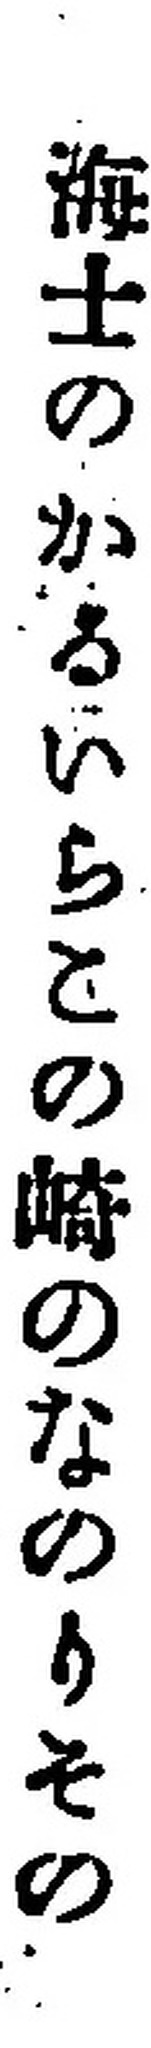海士のかるいらこの崎のなのりその
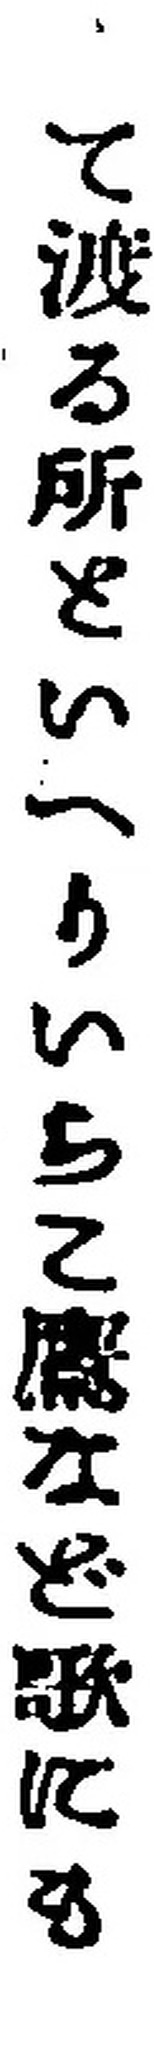て渡る所といへりいらこ鷹など歌にも
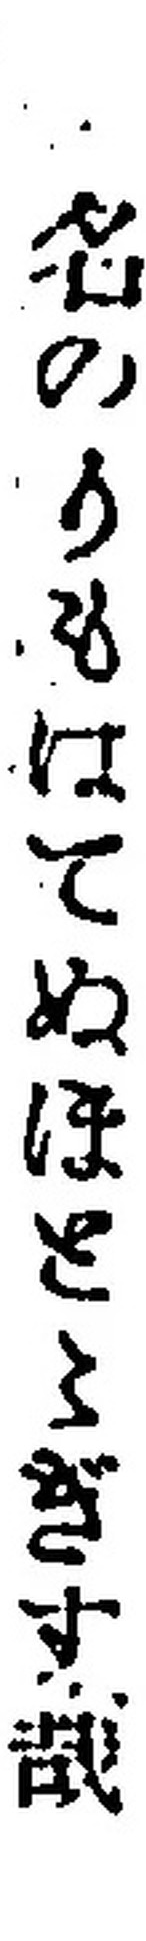名のりもはてぬほとゝぎす哉
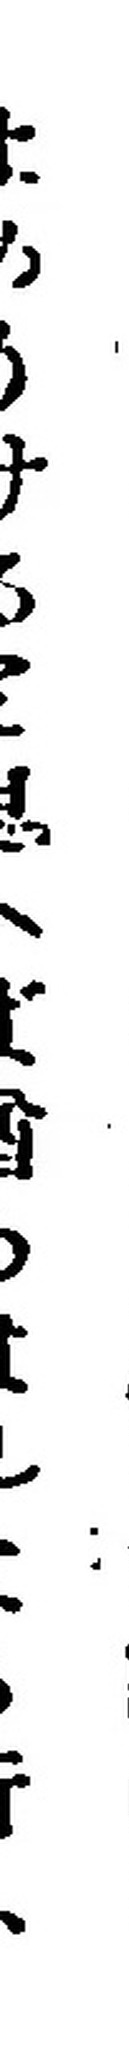よめりけると思へば猶あはれなる折ふ
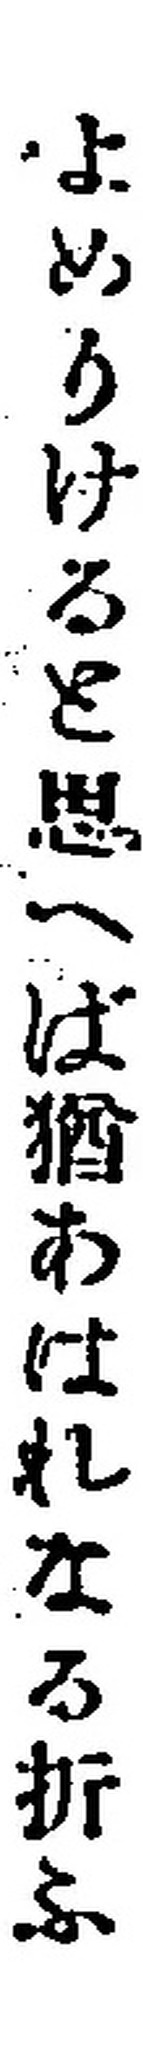よめりけると思へば猶あはれなる折ふ
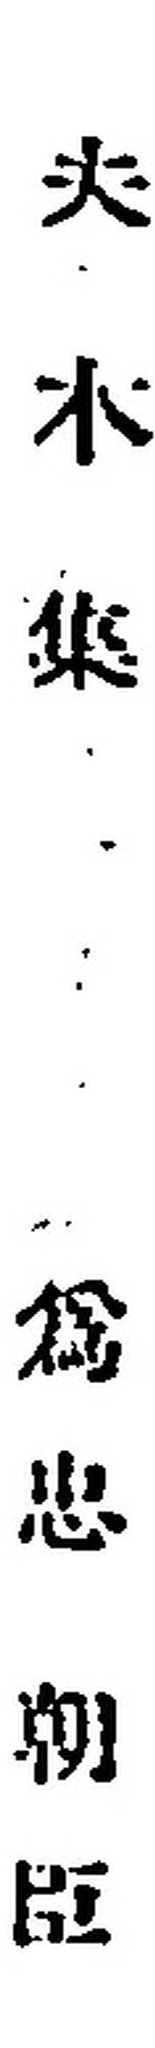夫木集為忠朝臣
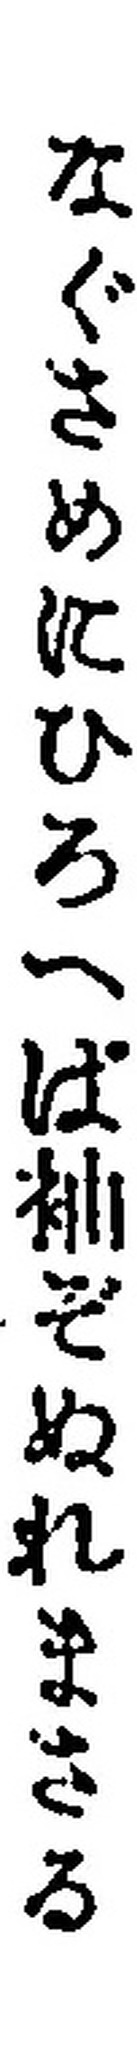なぐさめにひろへば袖ぞぬれまさる
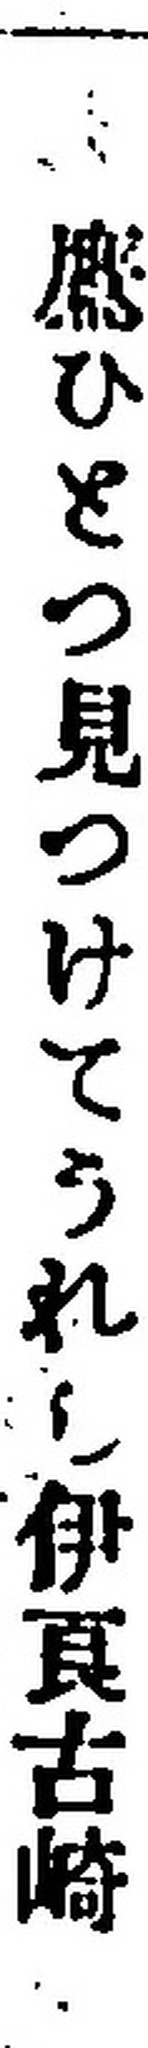鷹ひとつ見つけてうれし伊良古崎
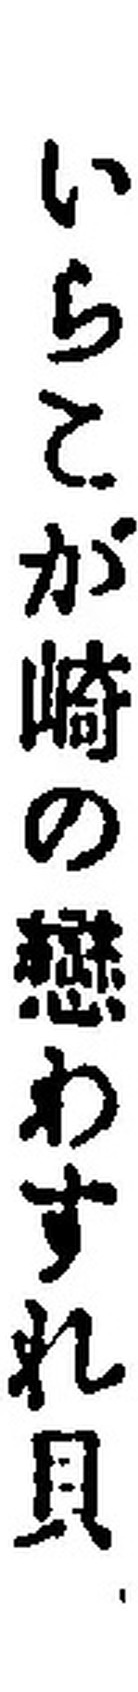いらこが崎の恋わすれ貝
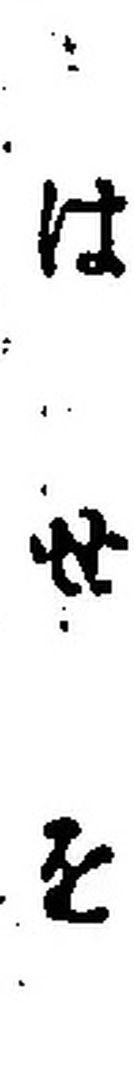はせを
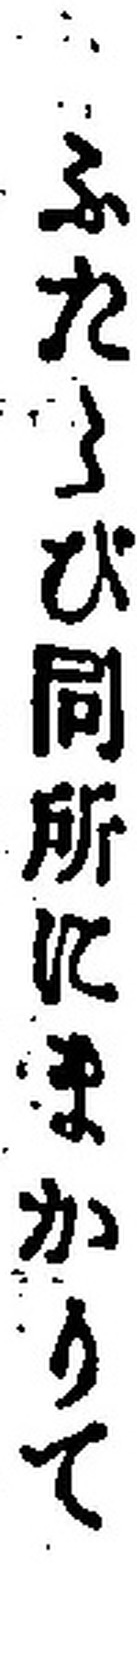ふたゝび同所にまかりて
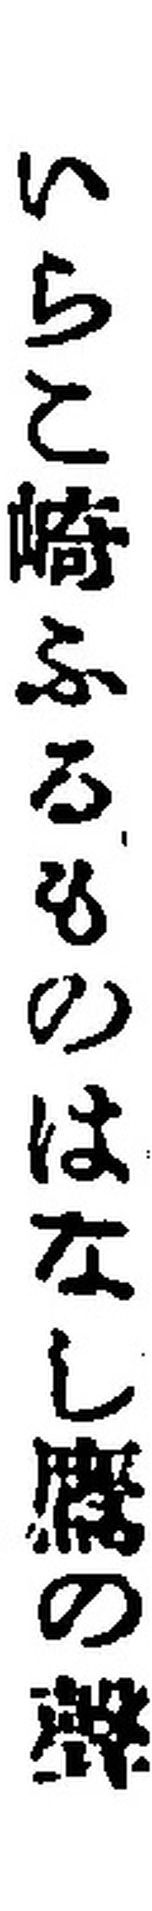いらこ崎ふるものはなし鷹の声
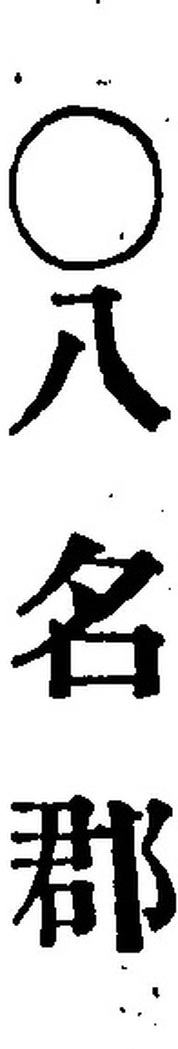○八名郡
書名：東参名勝案内
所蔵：国立国会図書館 National Diet Library, JAPAN
